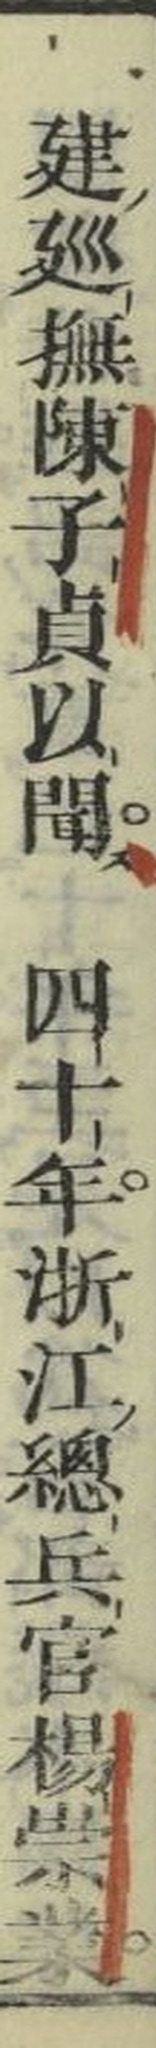建巡-撫陳-子-貞以-聞。四-十-年。浙-江総-兵-官楊-崇-業。
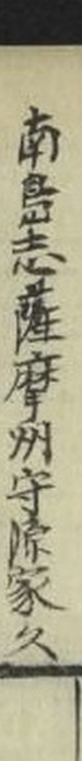南島志薩摩州守源家久
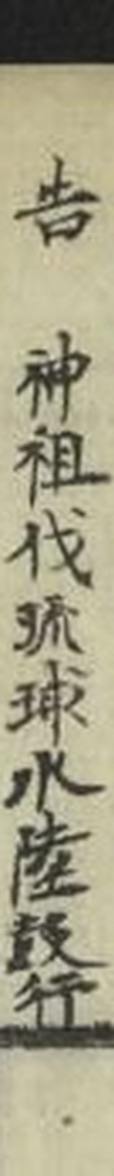告神祖伐琉球水陸鼓行
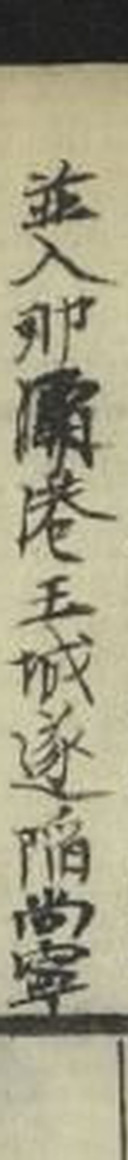並入那覇港王城遂陥尚寧
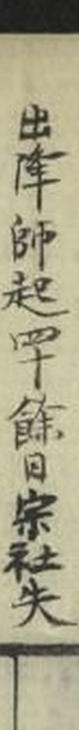出降師起四十余日宗社失
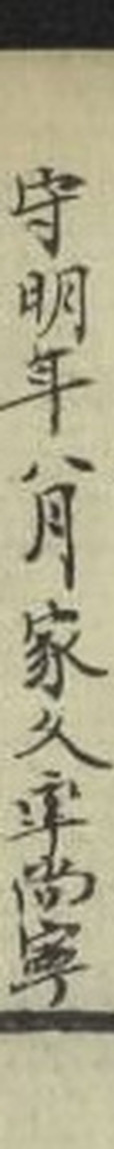守明年八月家久率尚寧
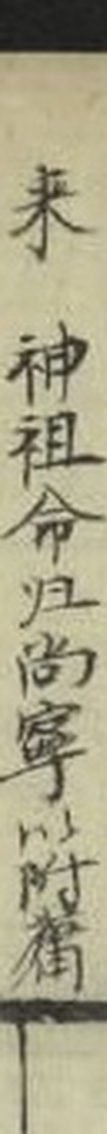来神祖命帰尚寧以附庸
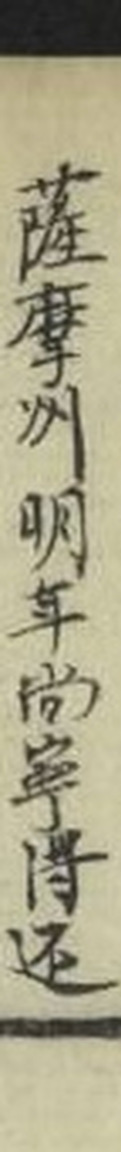薩摩州明年尚寧得還
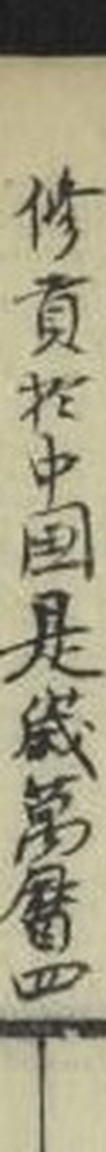修貢於中国是歳万暦四
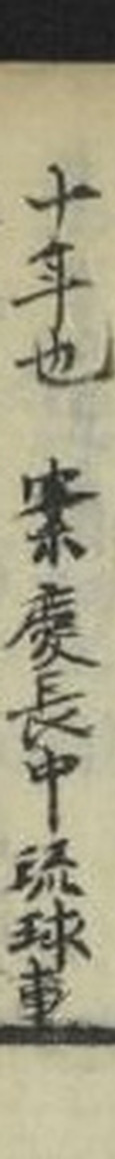十年也案慶長中琉球事
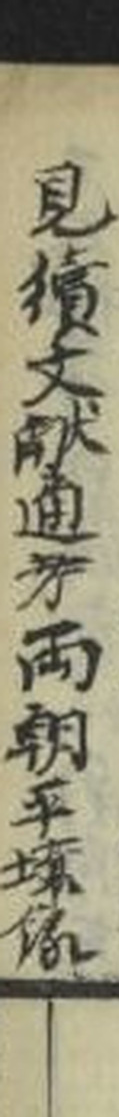見続文献通考両朝平壌録

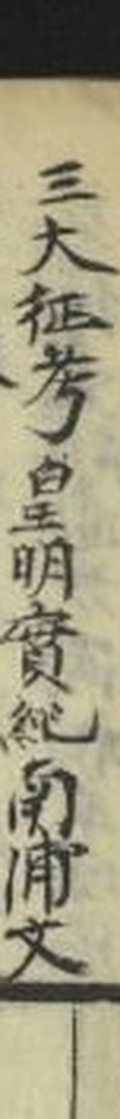三大征考皇明実記南浦文
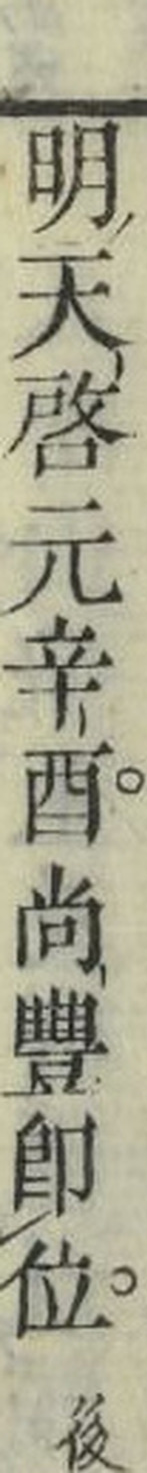明天-啓元辛-酉。尚-豊即位。
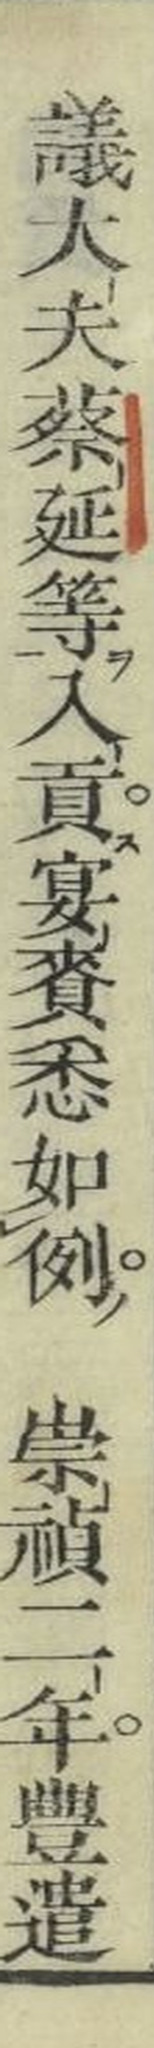議大-夫蔡-延等入-貢。宴-賚悉如例。崇-禎二-年。豊遣

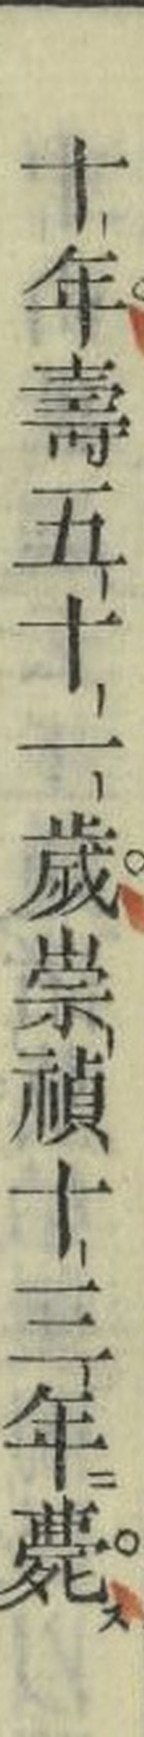十-年。寿五-十-一-歳。崇-禎十-三-年薨。
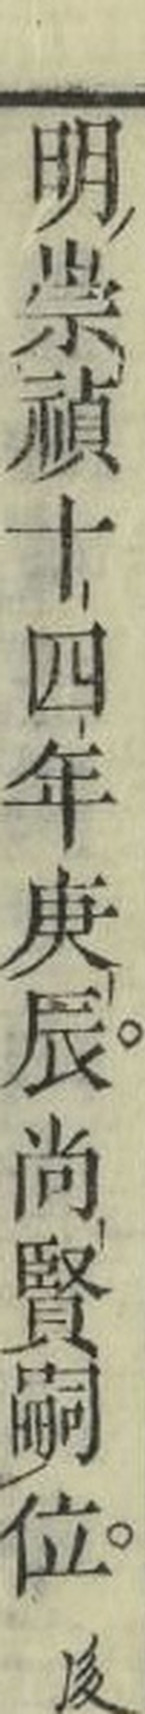明崇-禎十-四-年庚-辰。尚-賢嗣位。
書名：中山伝信録 巻三
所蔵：University of the Ryukyus Library
